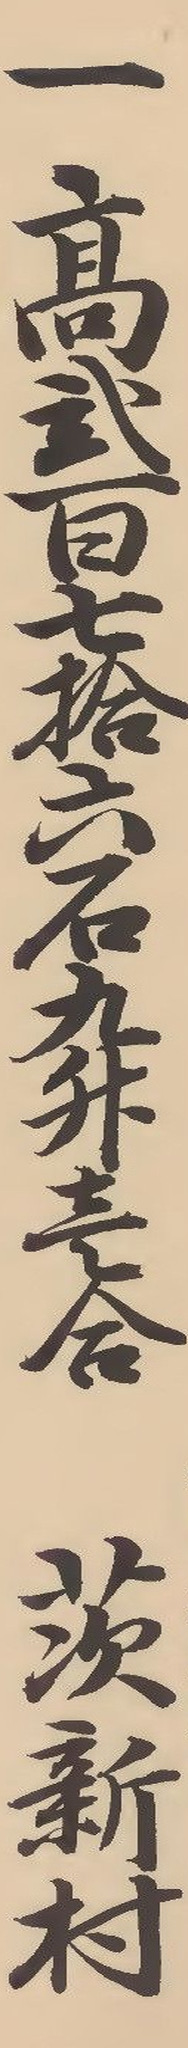一高弐百七拾六石九升壱合茨新村
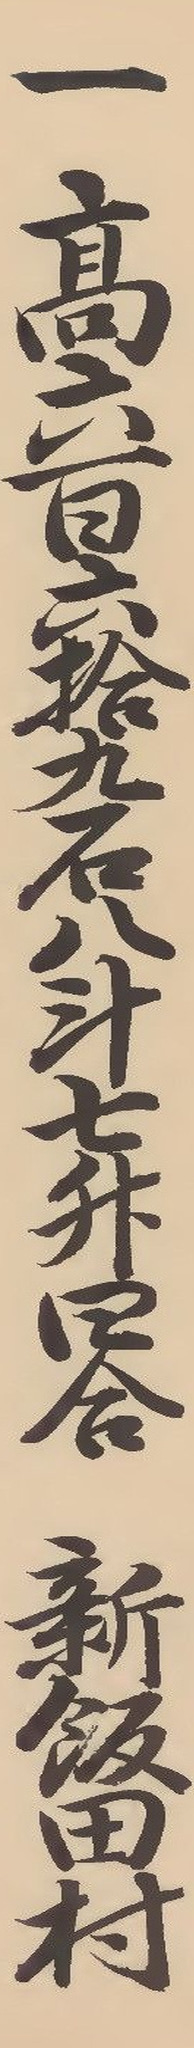一高六百六拾九石八斗七升四合新飯田村
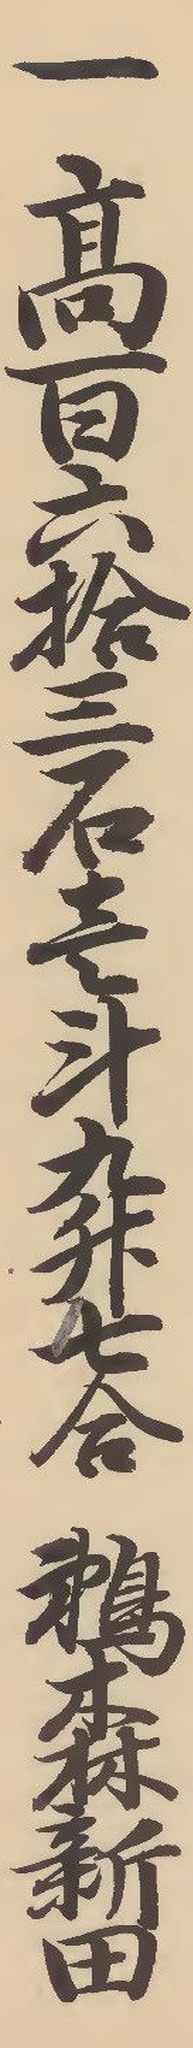一高百六拾三石壱斗九升七合鵜森新田

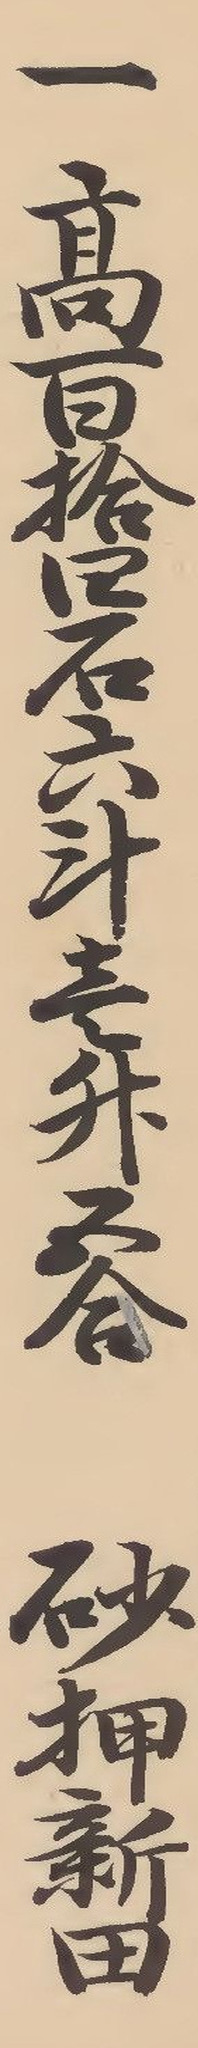一高百拾四石六斗壱升五合砂押新田
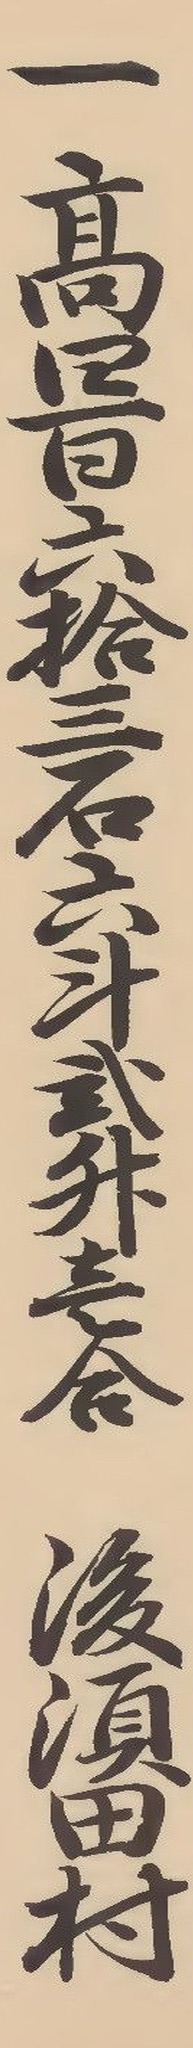一高四百六拾三石六斗弐升壱合後須田村
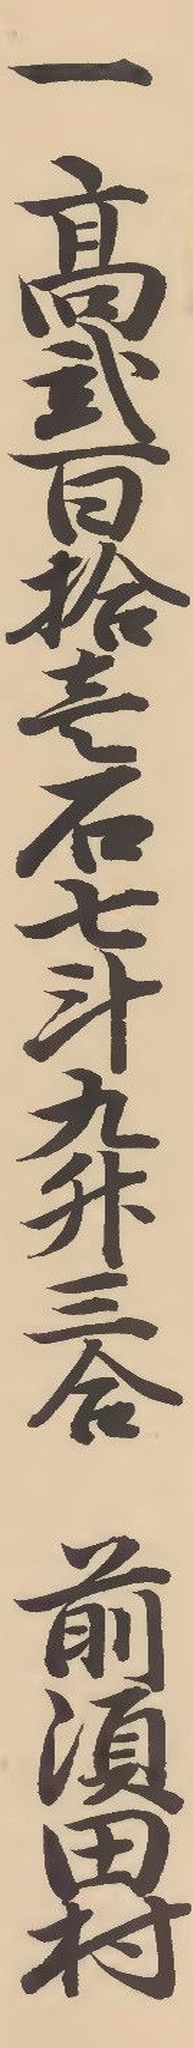一高弐百拾壱石七斗九升三合前須田村
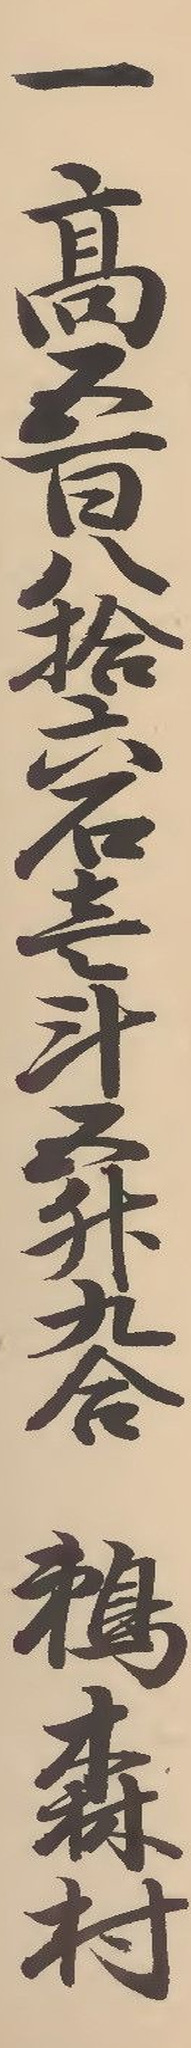一高五百八拾六石壱斗五升九合鵜森村
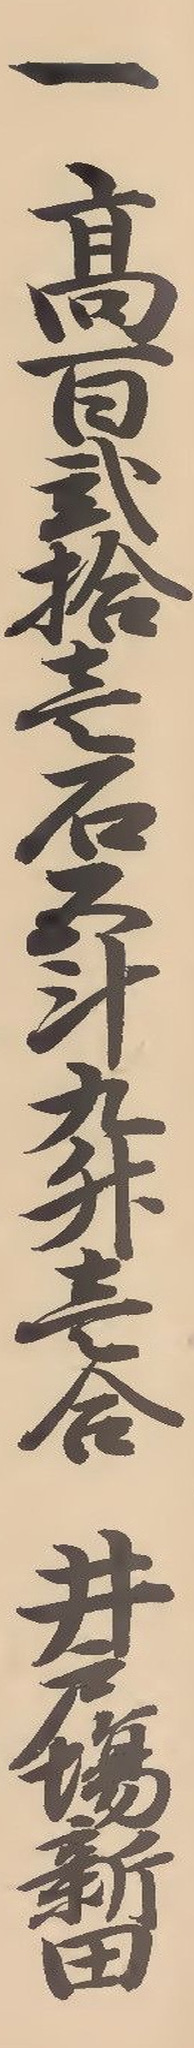一高百弐拾壱石五斗九升壱合井戸場新田
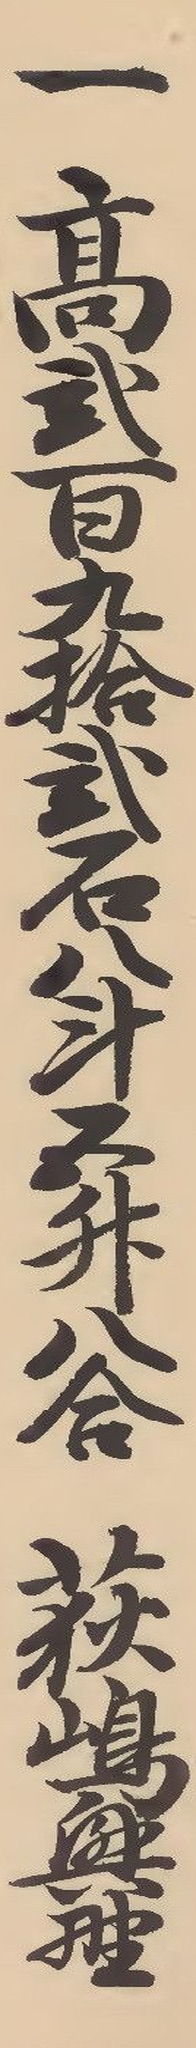一高弐百九拾弐石八斗五升八合荻島興野
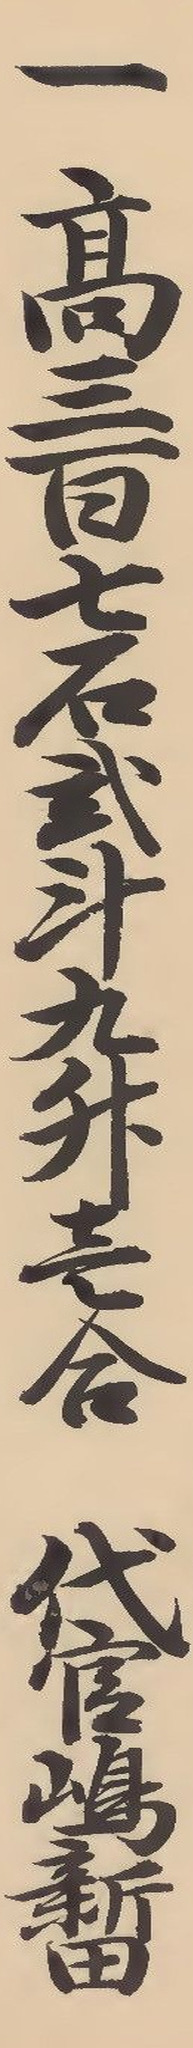一高三百七石弐斗九升壱合代官島新田
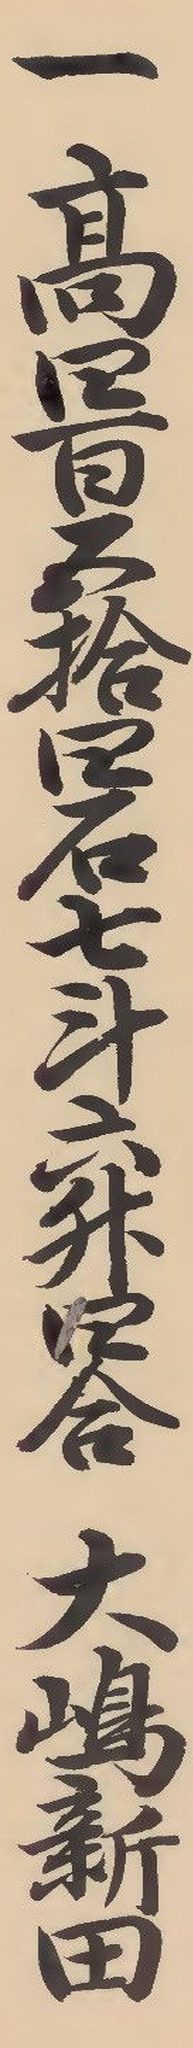一高四百五拾四石七斗六升四合大島新田

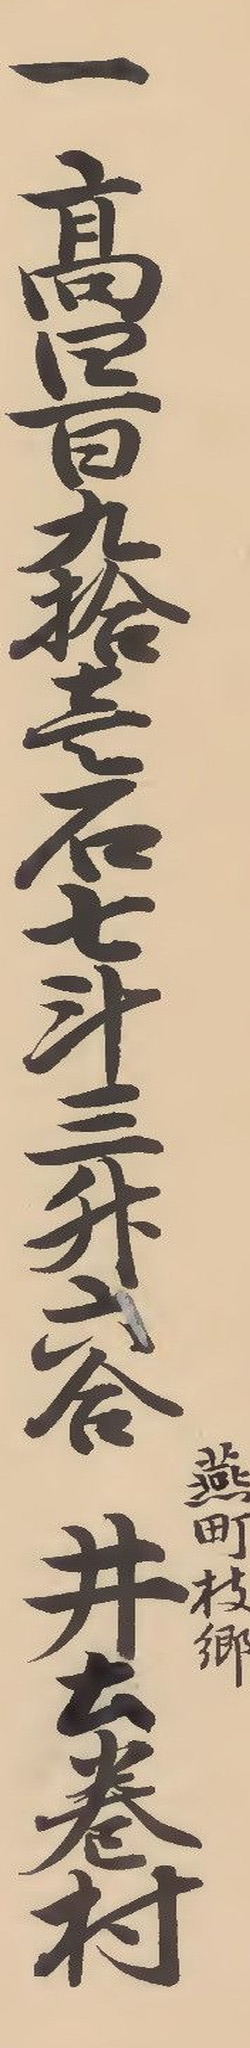一高四百九拾壱石七斗三升六合井土巻村
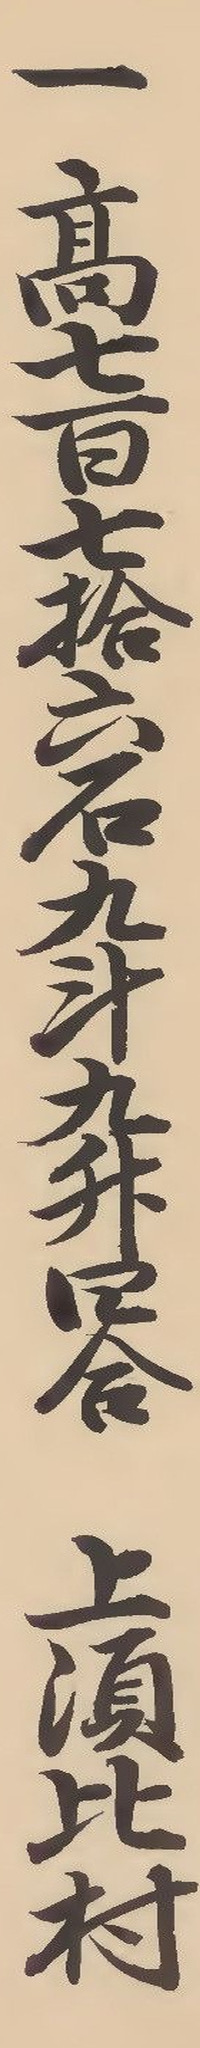一高七百七拾六石九斗九升四合上須比村
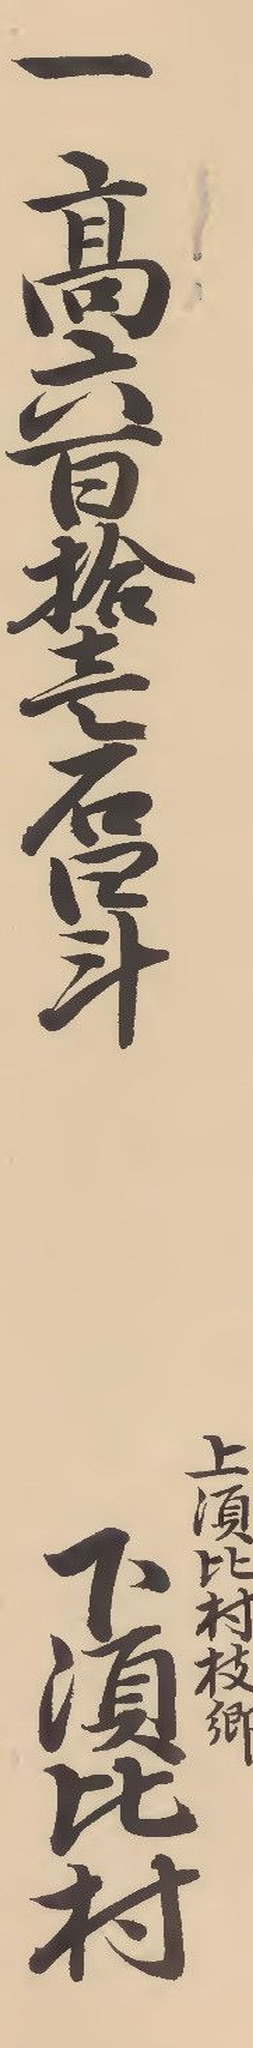一高六百拾壱石四斗下須比村
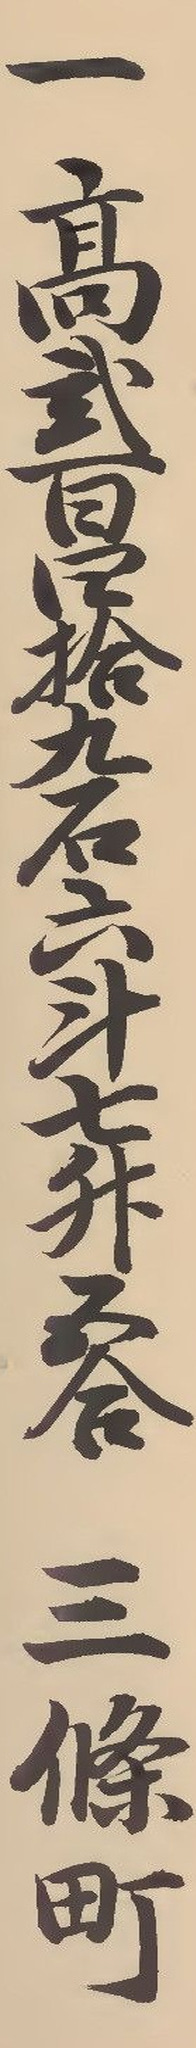一高弐百四拾九石六斗七升五合三条町
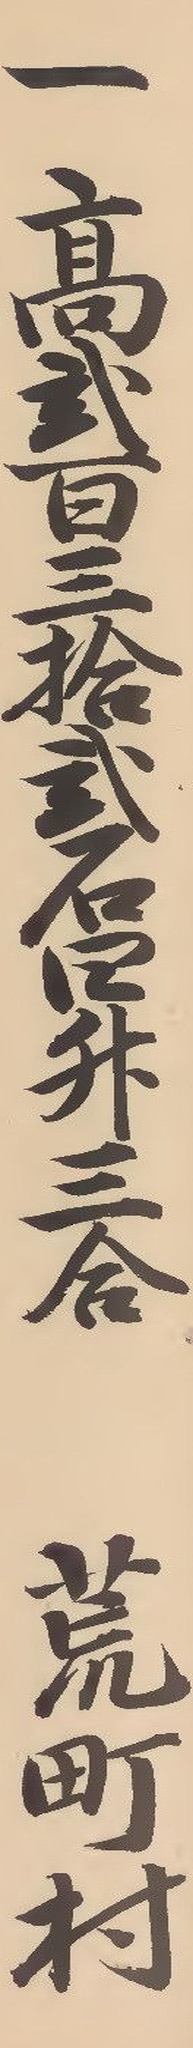一高弐百三拾弐石四升三合荒町村
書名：越後国郷帳　下
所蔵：国立公文書館 National Archives of Japan
